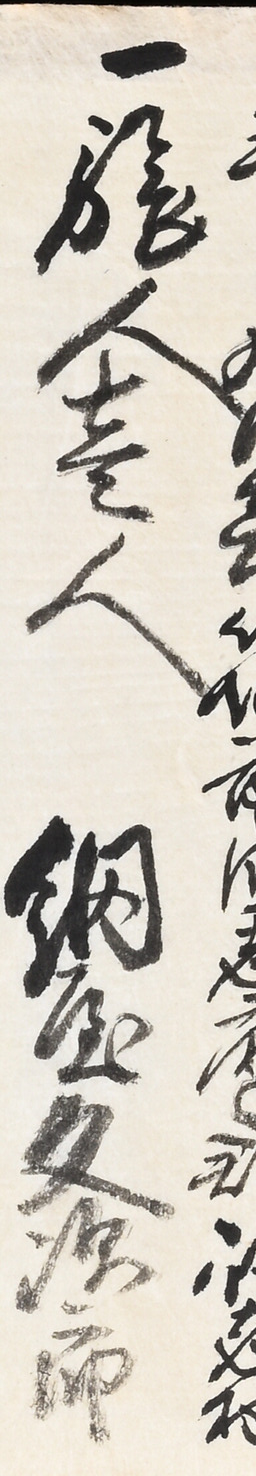一旅人壱人網屋文治郎
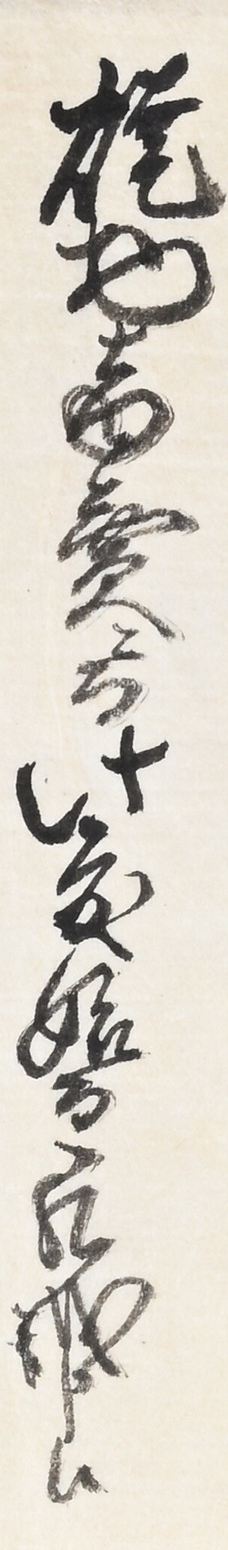焼物商売ニ而此度始而罷越申候
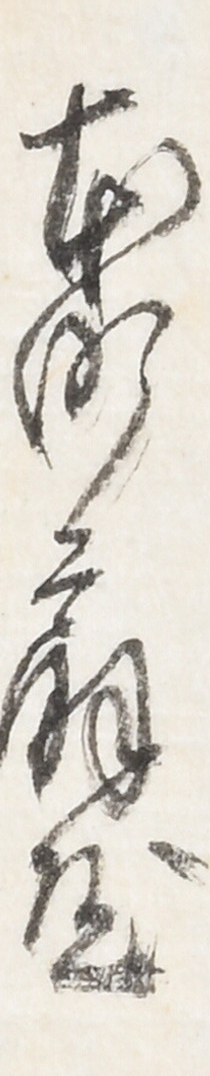本町扇屋
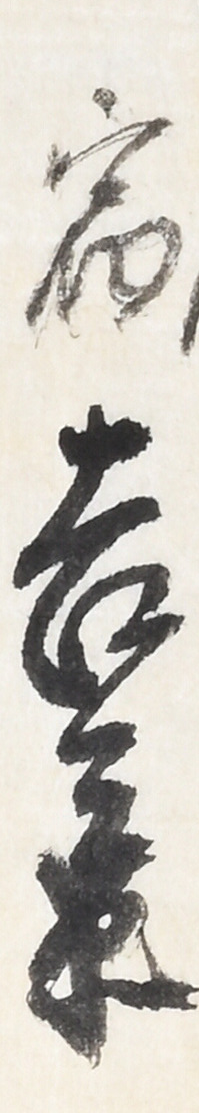宿吉兵衛
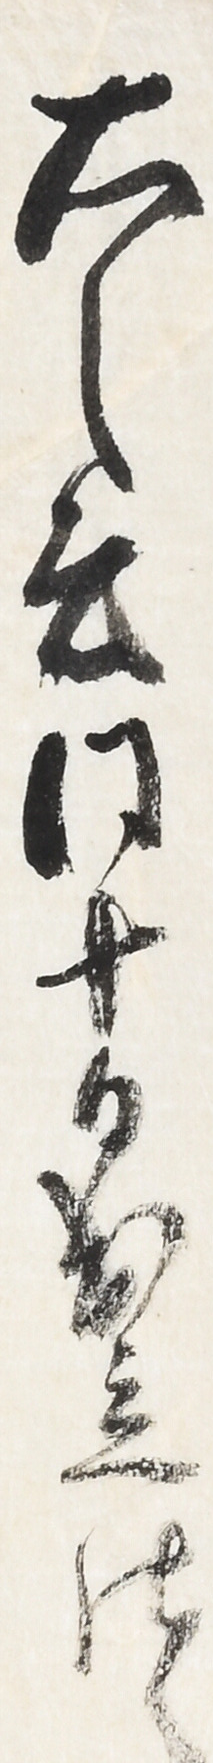右之者同十日出立仕候
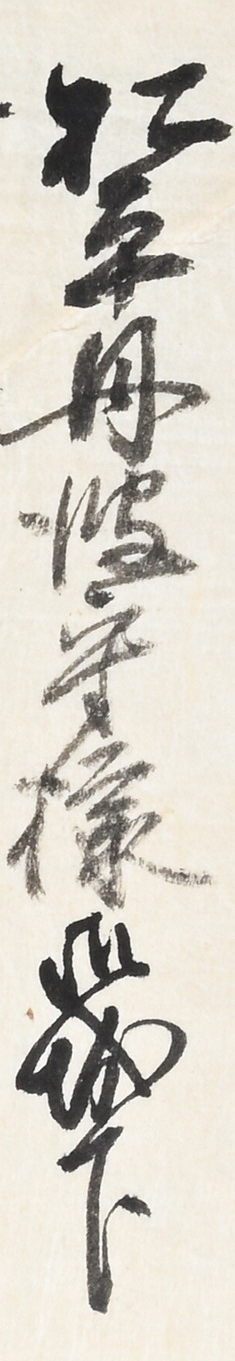松平丹波守様御城下
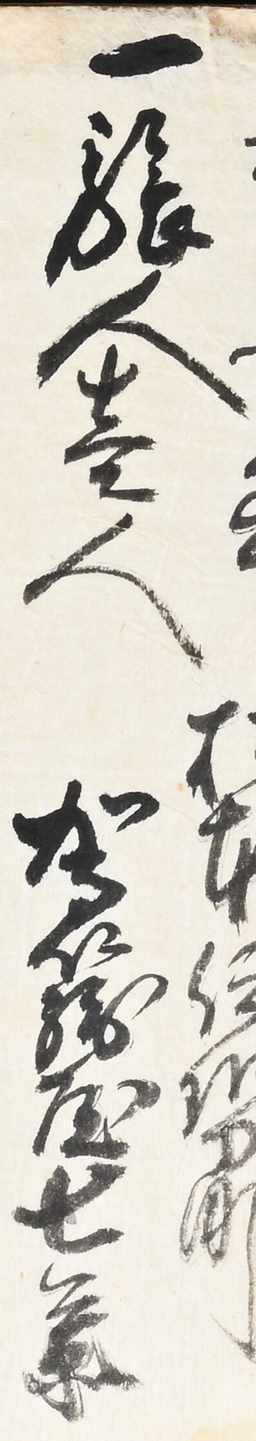一旅人壱人駕籠屋七兵衛
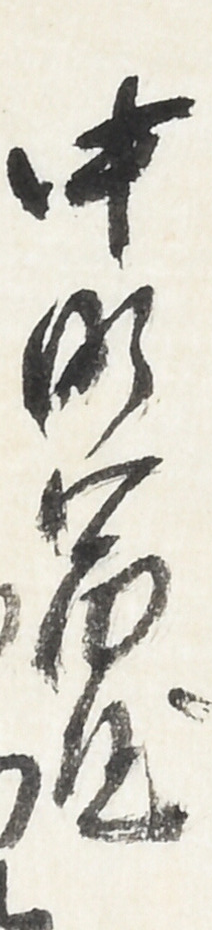中町冨屋
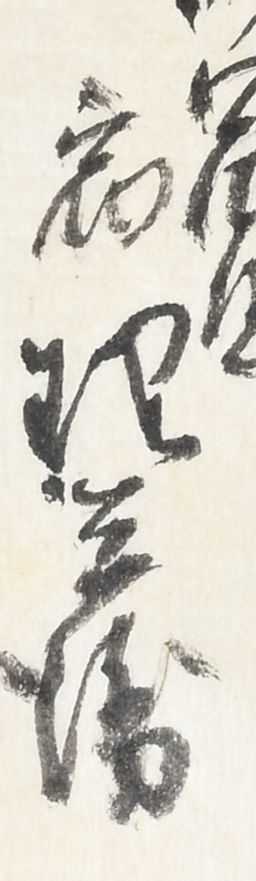宿理兵衛
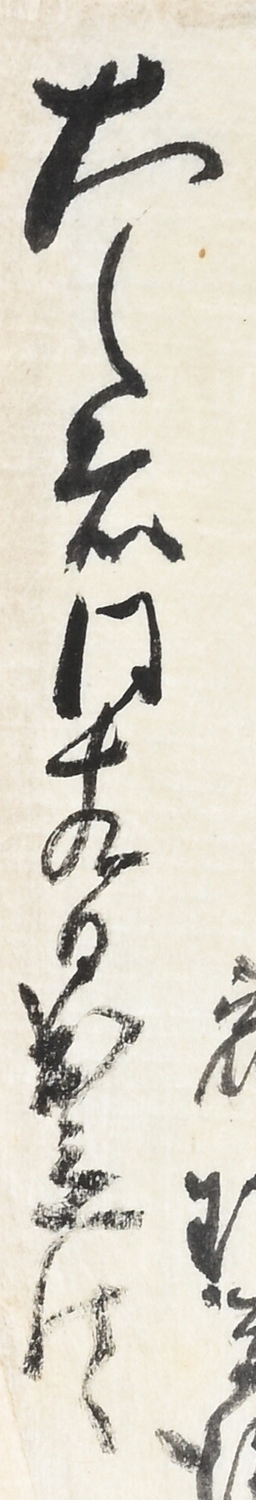右之者同十九日出立仕候

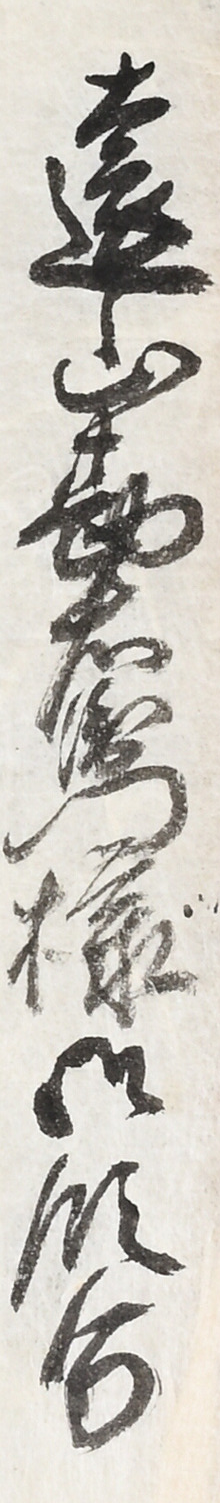遠山勘右衛門様御領分
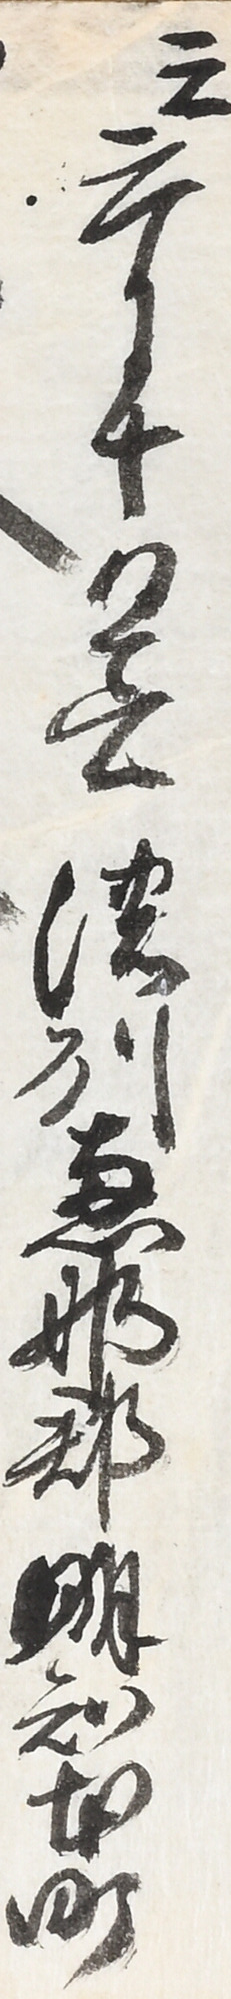壬六月十日着濃州恵那郡明知本町
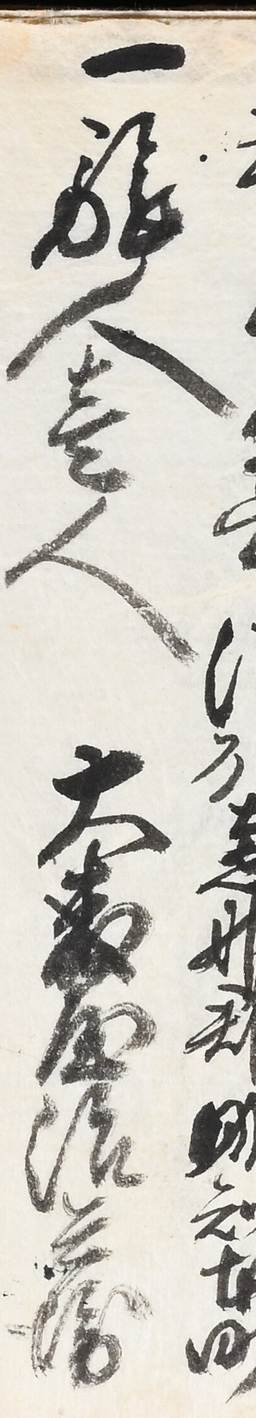一旅人壱人大森屋治兵衛
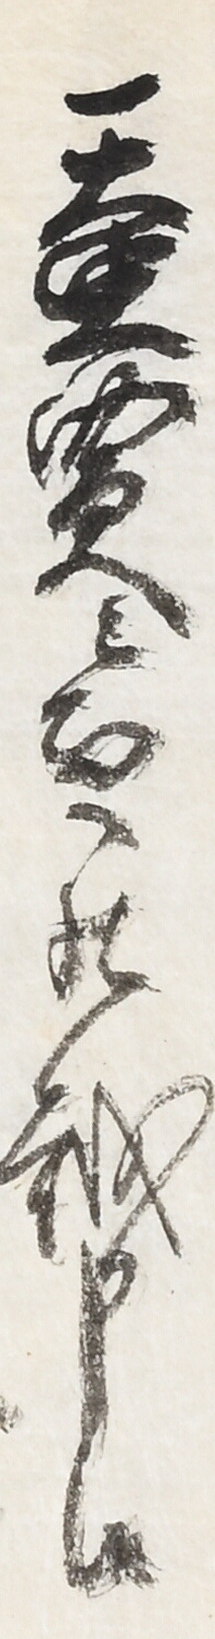蚕買ニ而罷越申候
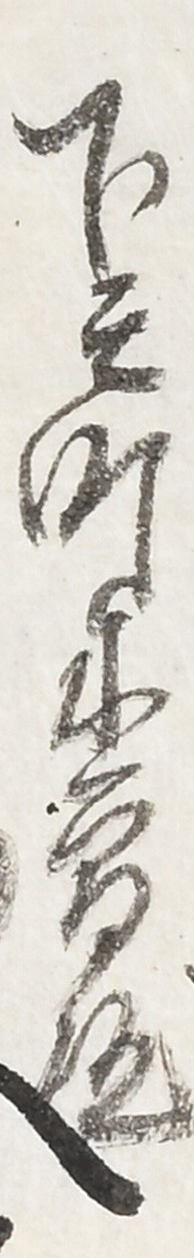下モ町木曽屋
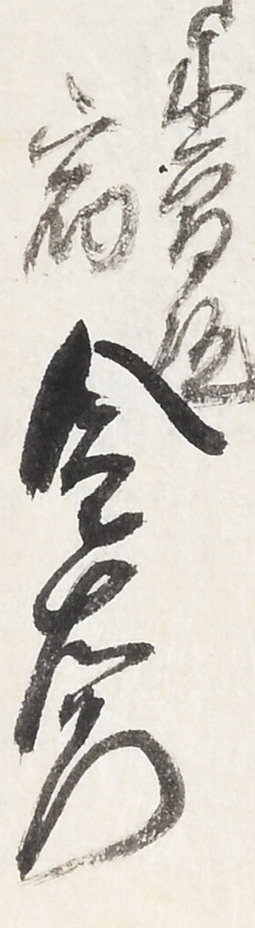宿金右衛門
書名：旅人泊控帳
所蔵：伊那市立高遠町図書館・合同会社AMANE
